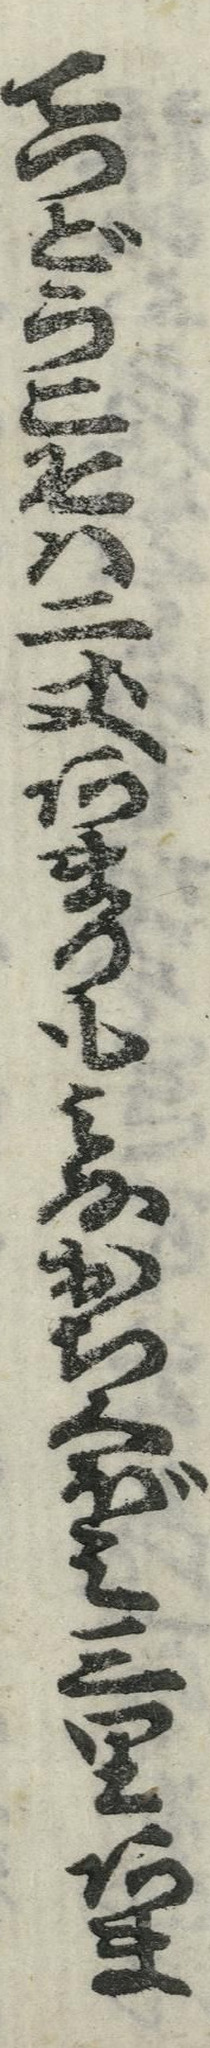てつどうこそは二丈あまりもみなおちくぼみ三里あま
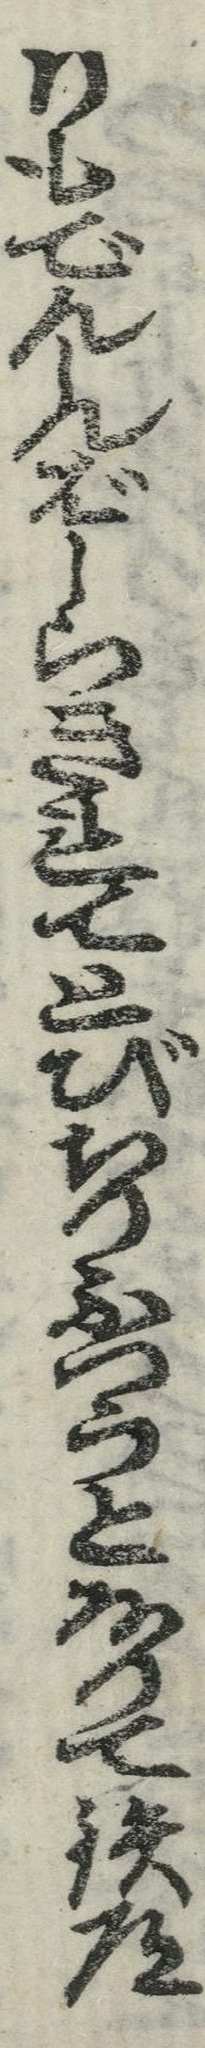りもでんしんばしらきれてとびちりふつうとなりて鉄道
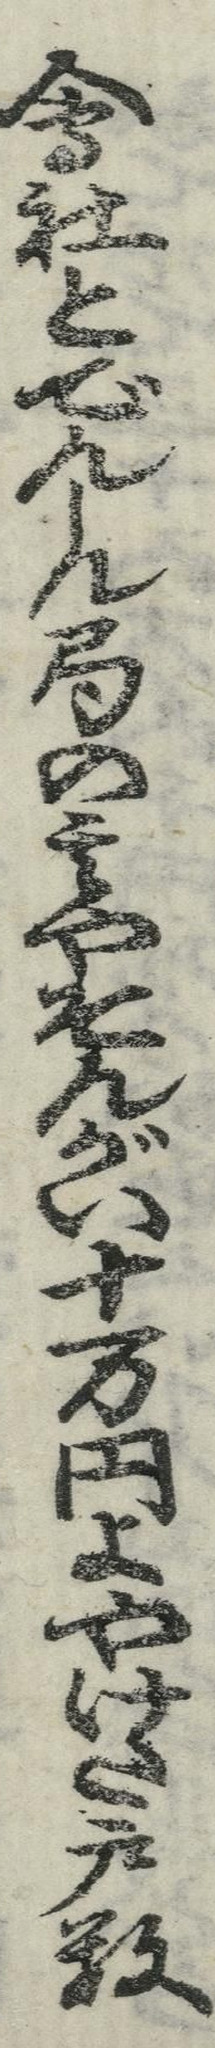会社とでんしん局の其やそんがい十万円よやけた戸数
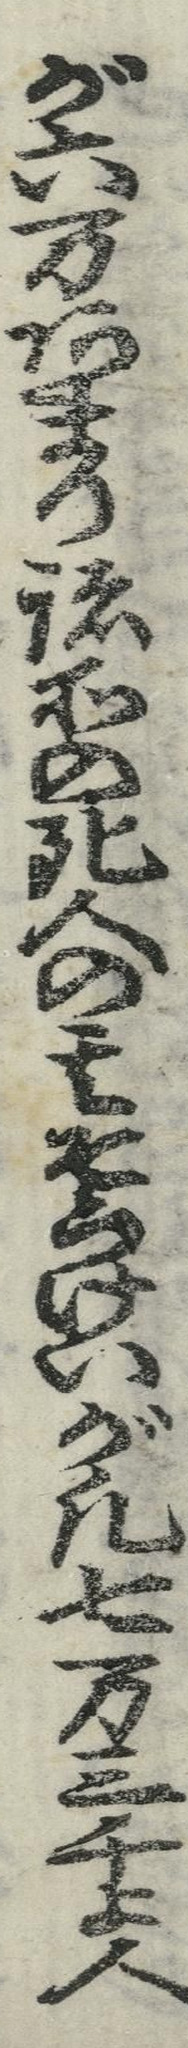が六万あまり諸所の死人の其そうけいが凡七万三千よ人
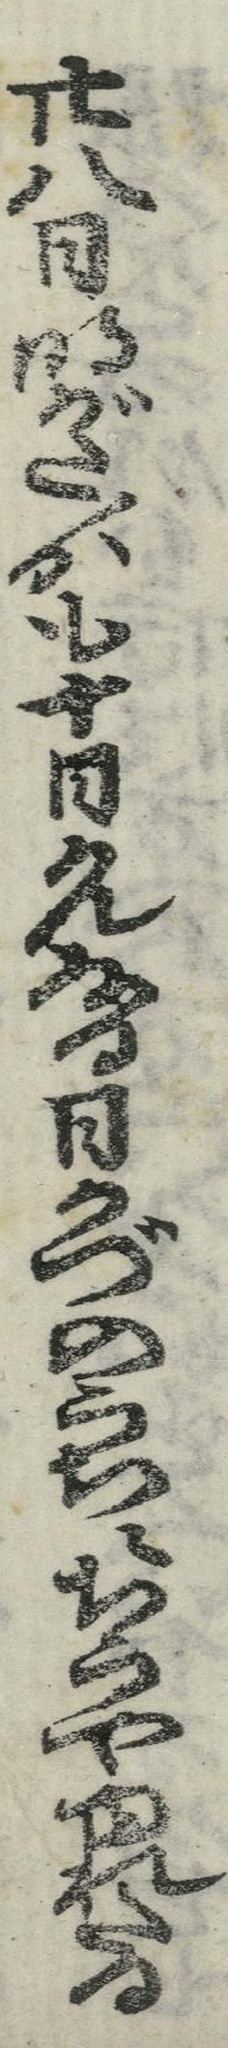廿八日明がたゟも十日かんなる日かづのうちにちうやゆれたる
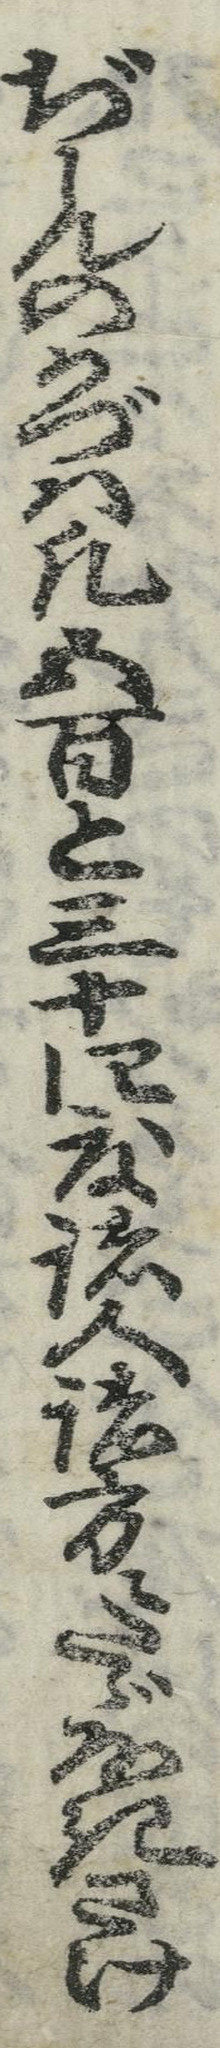ぢしんのかづは凡五百と三十四度諸人諸方にたゞなきさけ
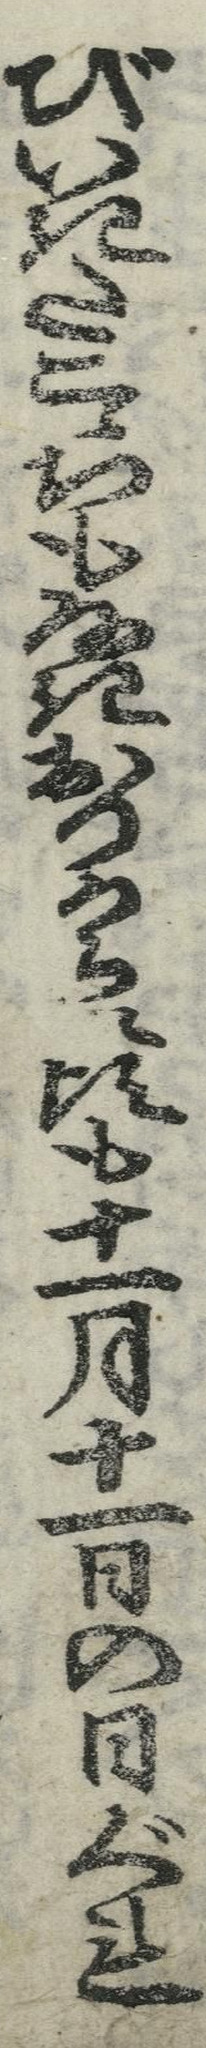びいきたこゝちもなきおりからに頃も十一月十一日の日ぐれ
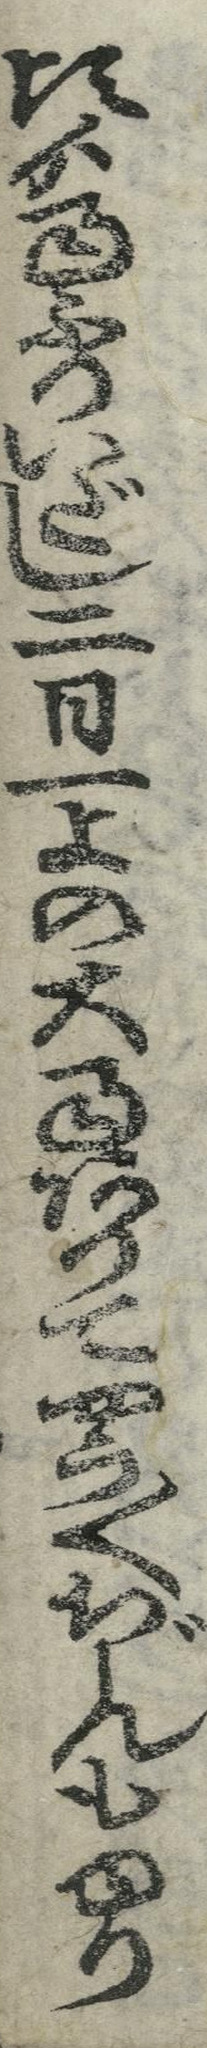頃ゟ雨ふりいだし二日一よの大雨ありてやう〳〵ぢしんもゆり

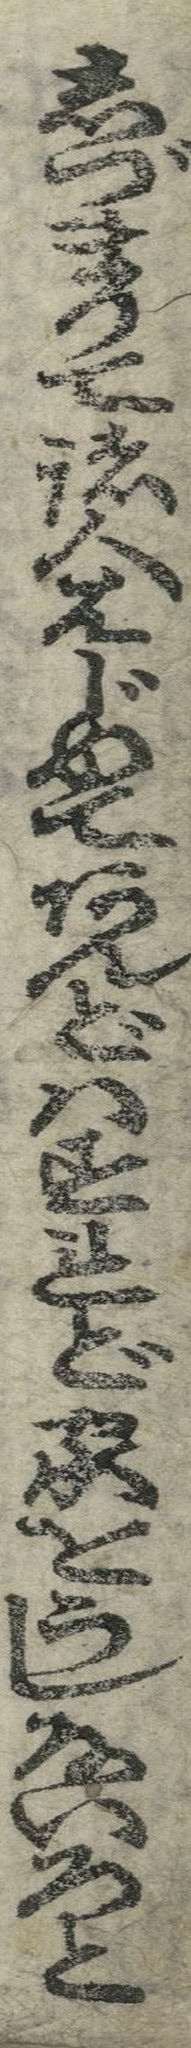しづまりて諸人はじめてあんどはすれど家をうしないろと
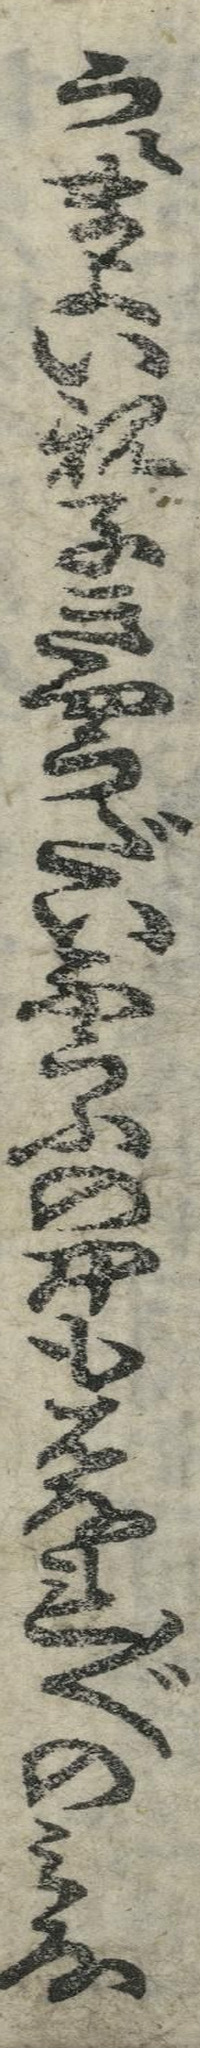うにまよい親子きやうだいふうふの中もはなれ〴〵のみな
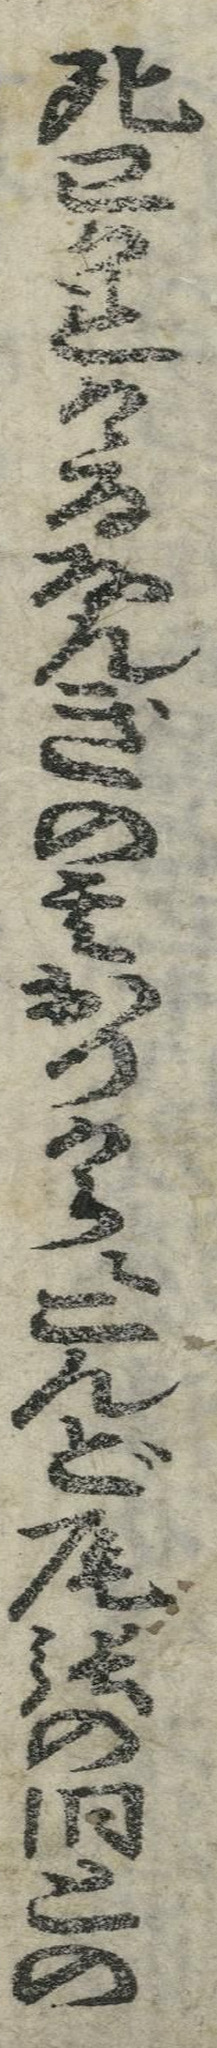死わかれけるなんぎの其おりからにこんど尾張の旧との
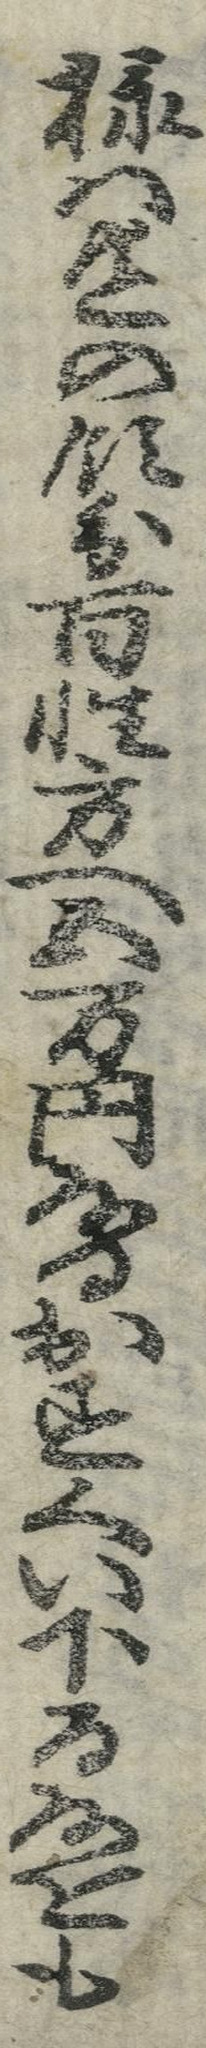様はもとの領分百姓方へ五万円なるおすくい下るなをも
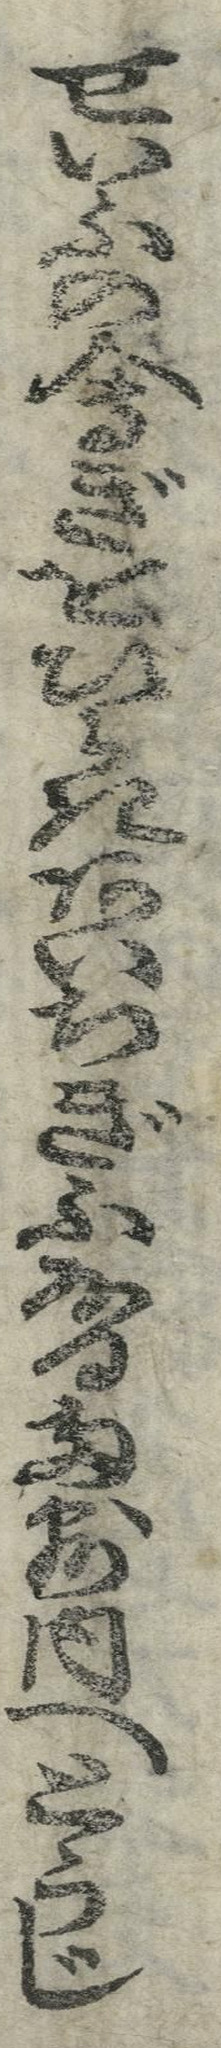せいふの会ぎをひらきあいちぎふなる両県内へとうじ
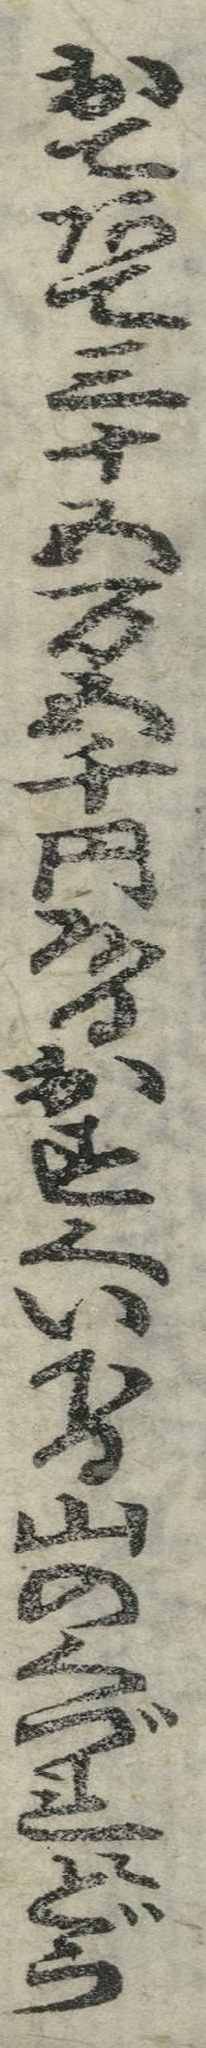おてあて三十五万五千円なるおすくい下る山のくづれにどう
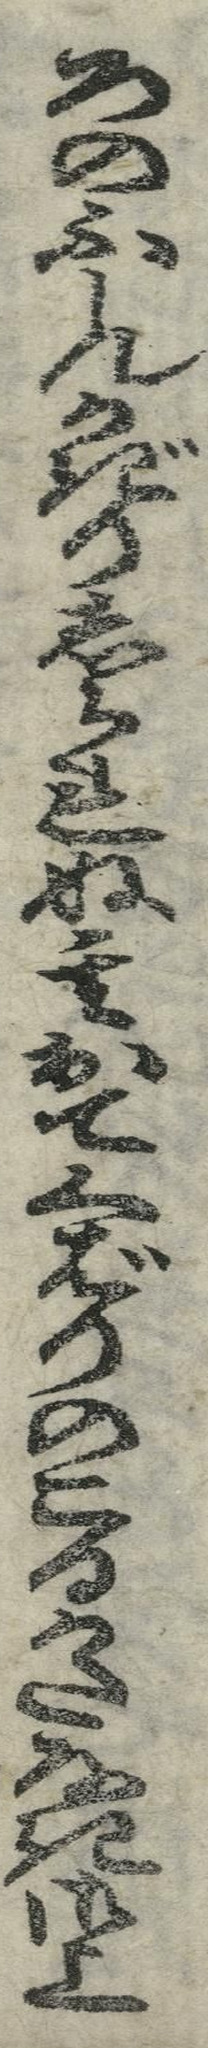ろのふしんかぎりしられぬ其おてくばりのこるかたなき御上
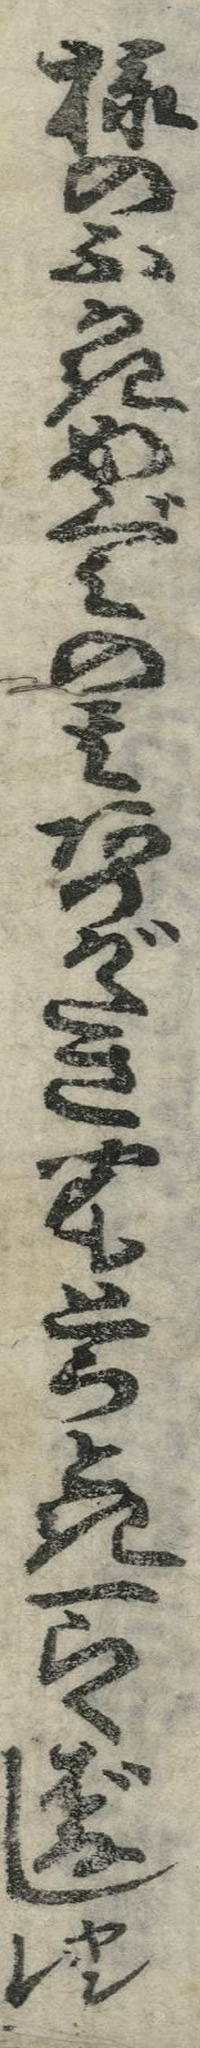様のふかきめぐみの其ありがたき聞もとうとき一らくばなしヤンレ
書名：十二ヶ国大地しんくどき
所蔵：東京大学地震研究所図書室 Earthquake Research Institute Library, The University of Tokyo, JAPAN
